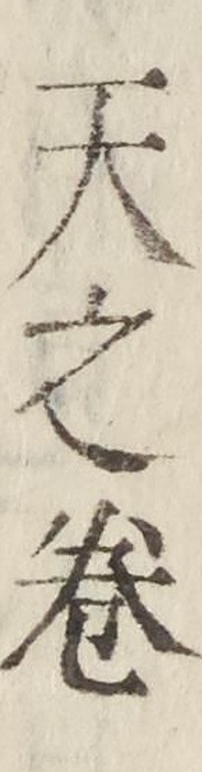天之巻
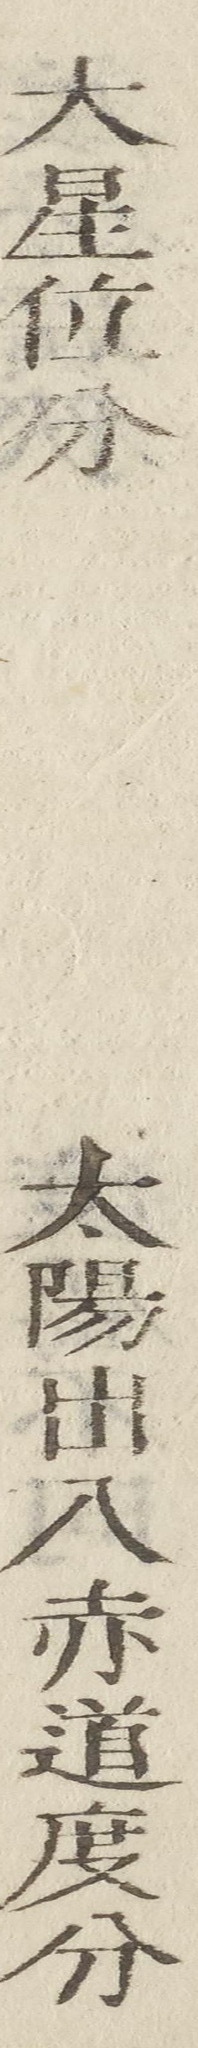大星位分太陽出入赤道度分
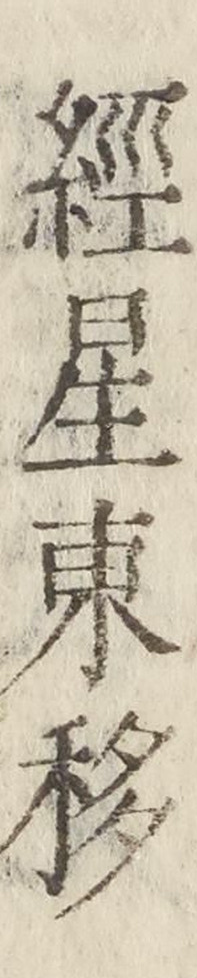経星東移
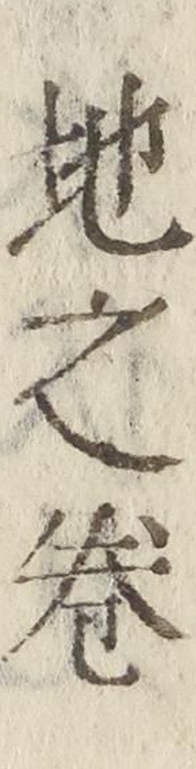地之巻
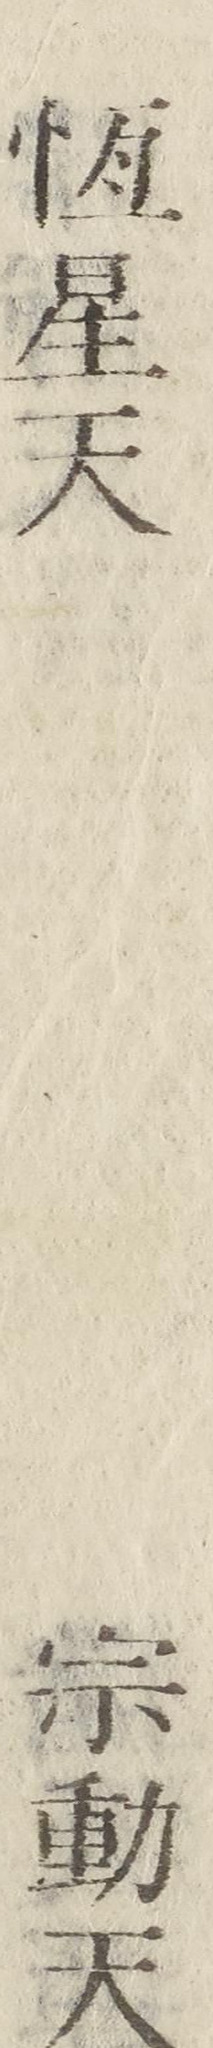恒星天宗動天

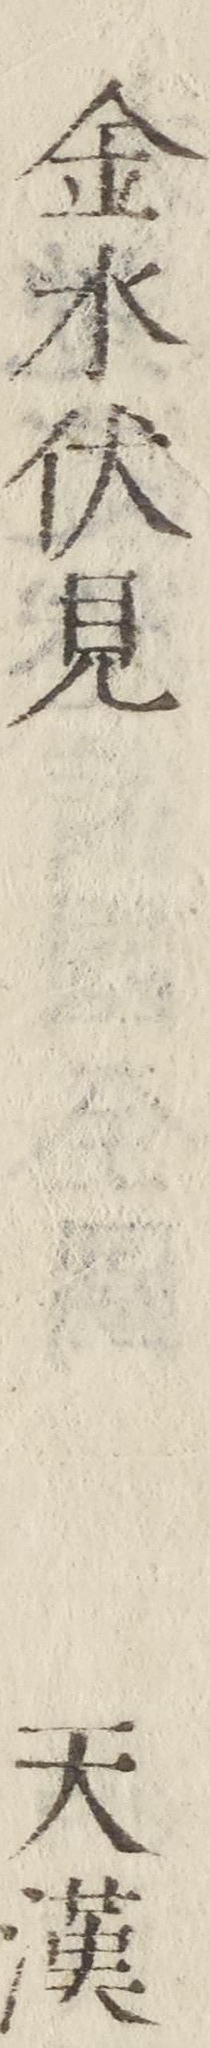金水伏見天漢

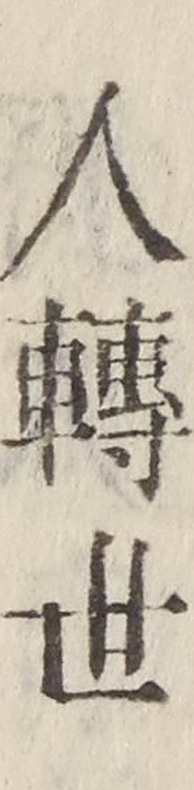人転生
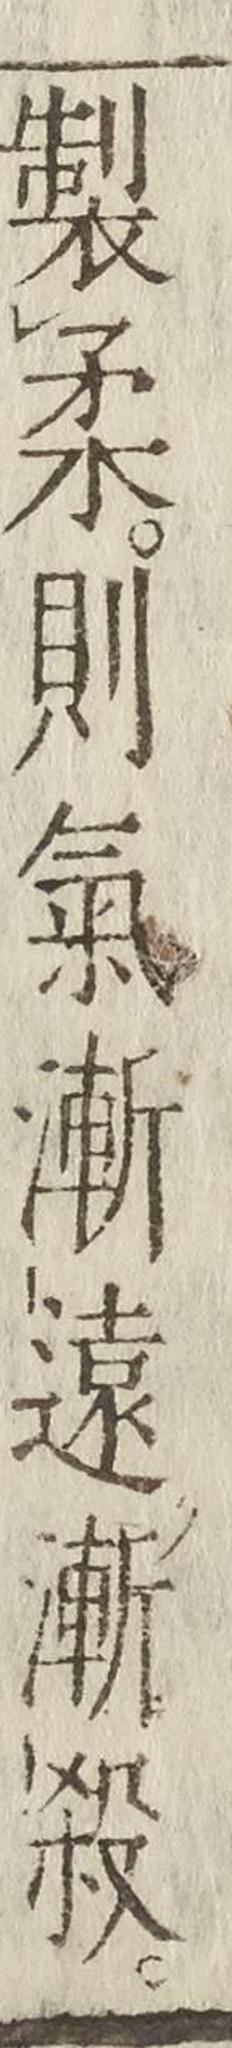製柔。則気漸ー遠漸ー殺。
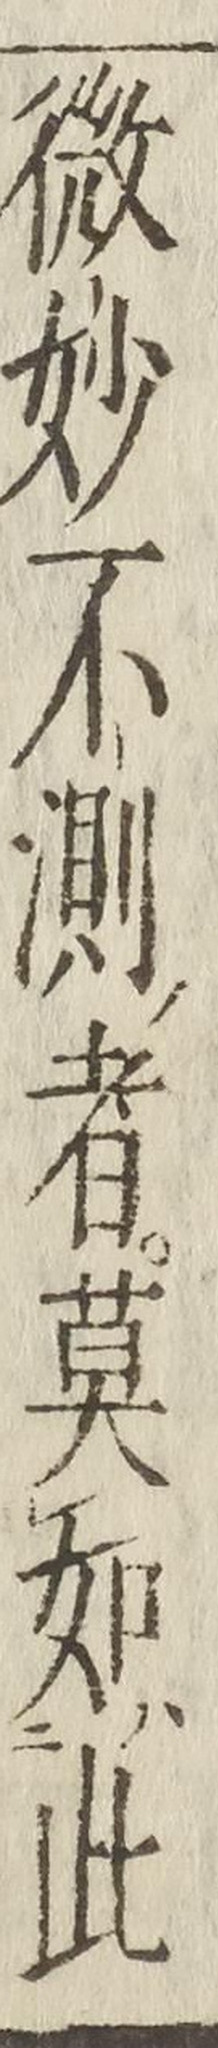微ー妙不ー測者。莫如此
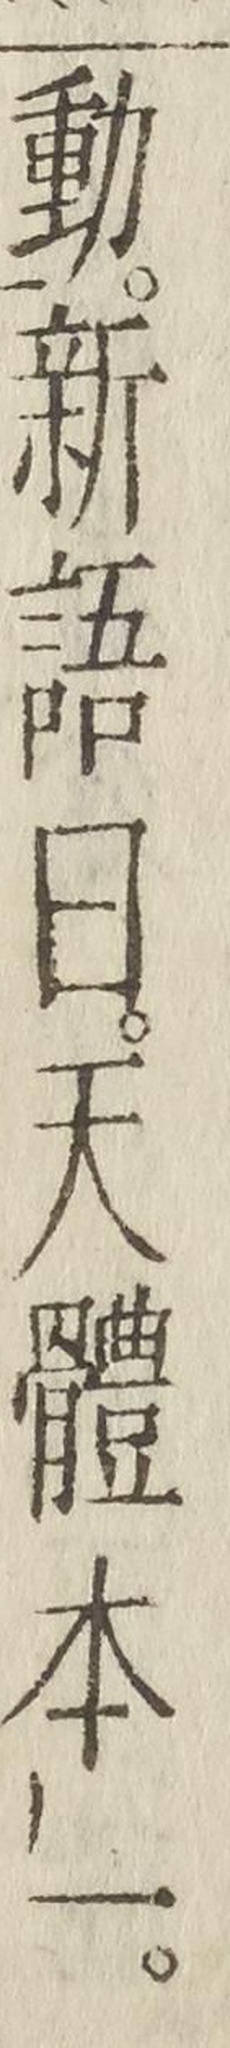動。新語曰。天体本ー一。
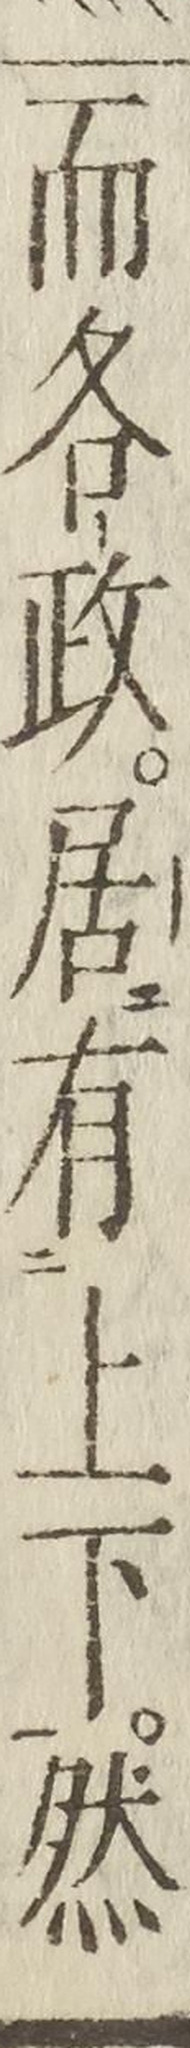而各ー政。居有上下。然
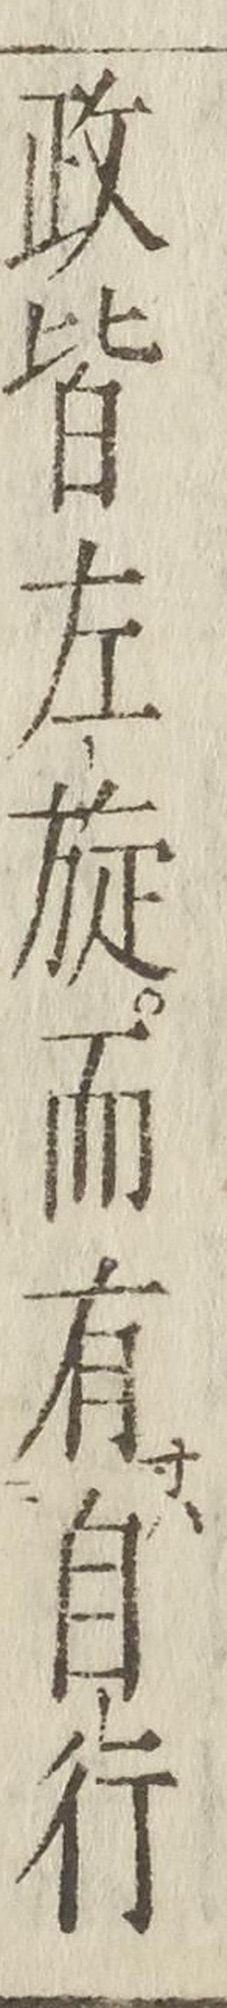政皆左ー旋。而有時ハ自ー行
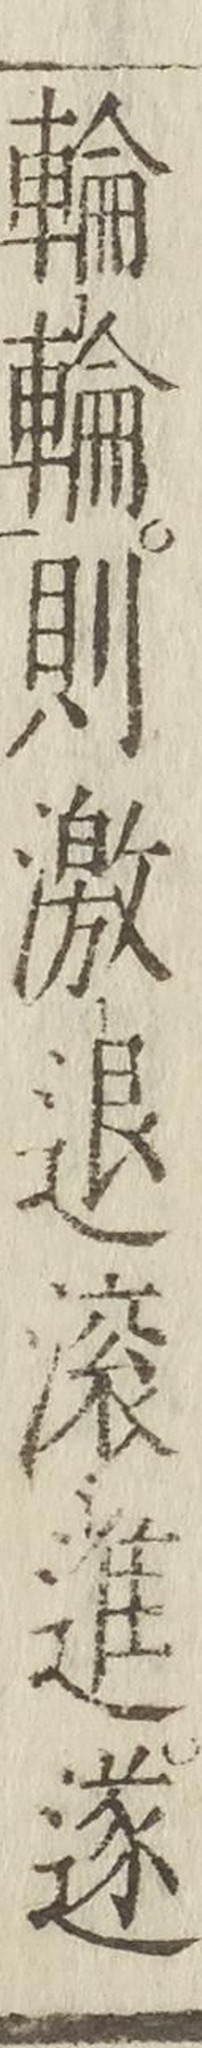輪ー輪。則激ー退滾ー進。遂
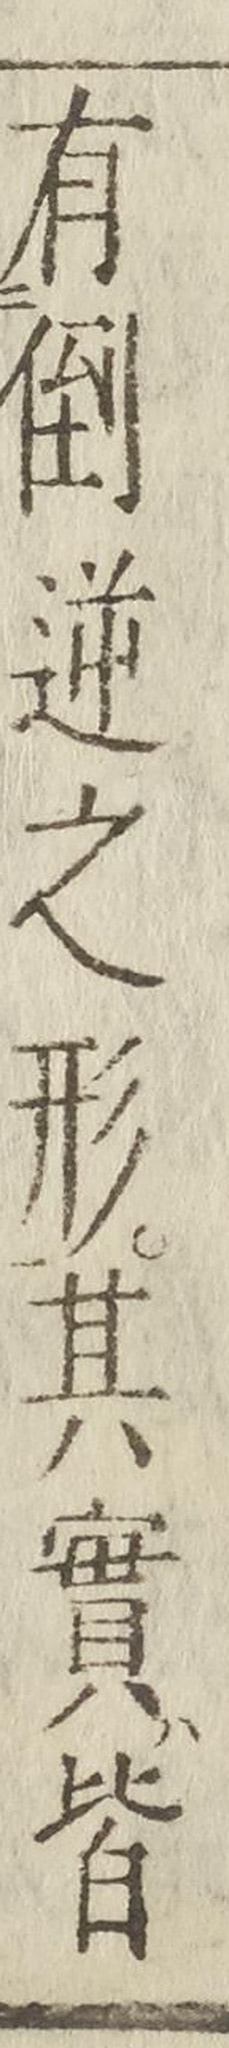有倒逆之形。其実皆
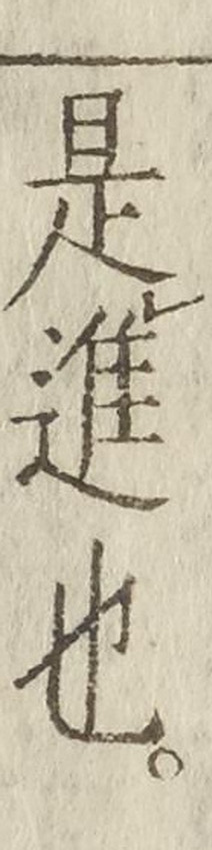是進也。

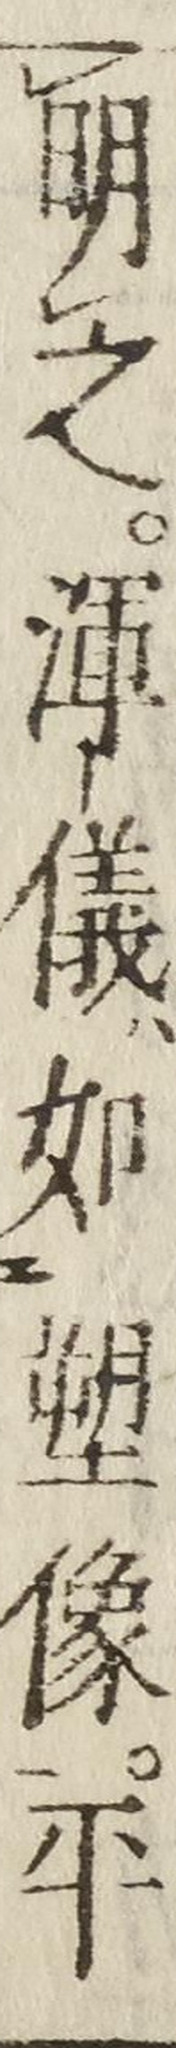明之。渾ー儀如塑像。平
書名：天經或問　序圖
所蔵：東京大学地震研究所図書室 Earthquake Research Institute Library, The University of Tokyo, JAPAN
